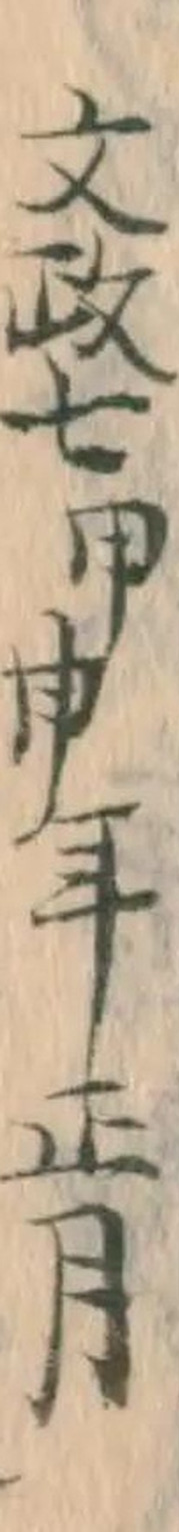文政七甲申年正月
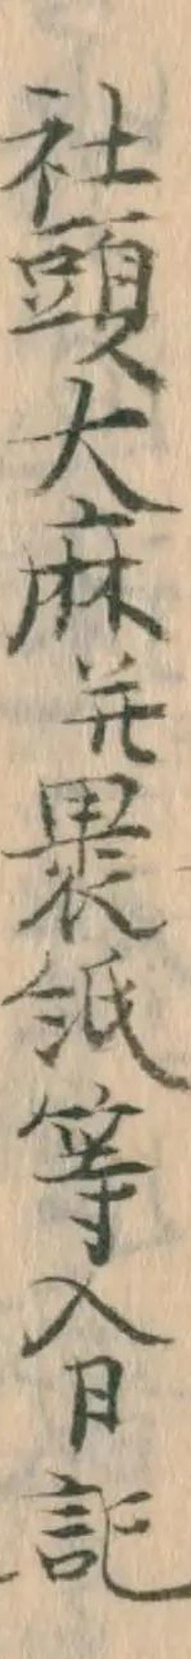社頭大麻幷褁紙等入日記
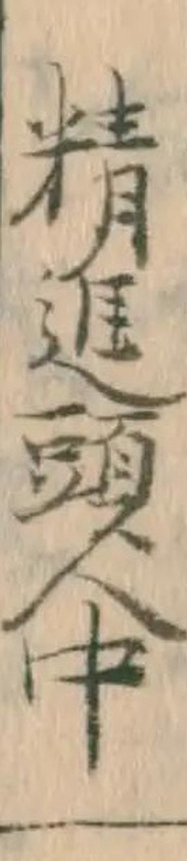精進頭人中
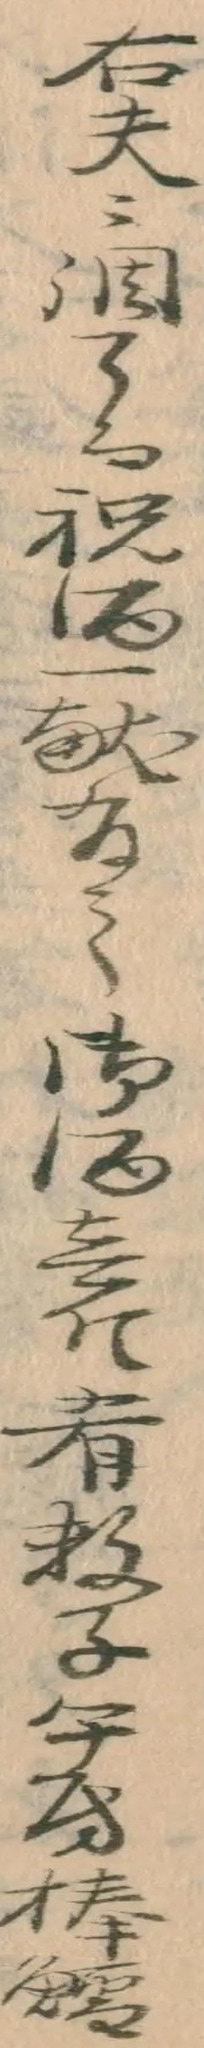右夫々調了而祝酒一献有之御酒壱升斤肴数子午房棒鱈
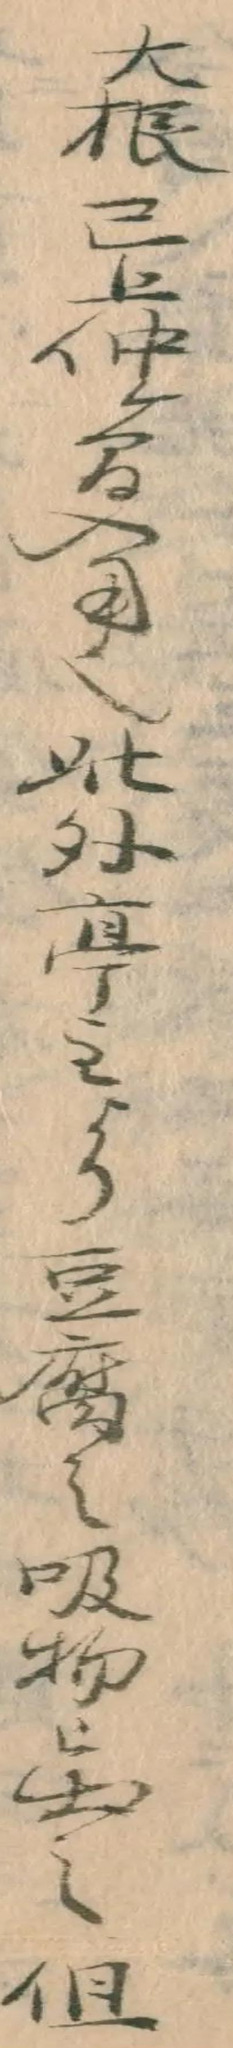大根已上仲ヶ間入用也此外亭主より豆腐之吸物被出之但
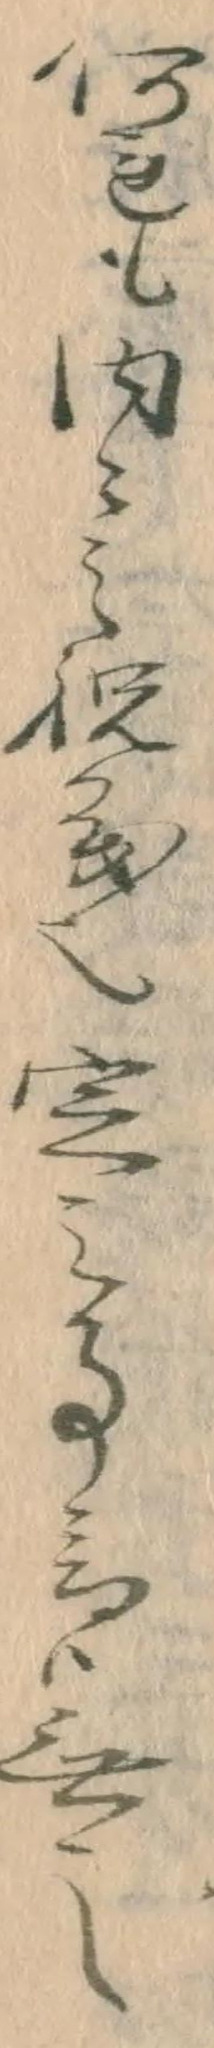何れも内々之祝義也定之事ニ而ハ無之
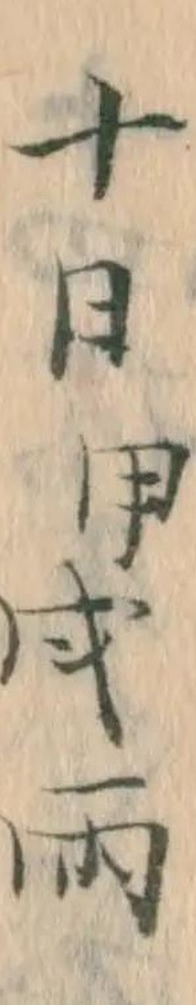十日甲戌雨
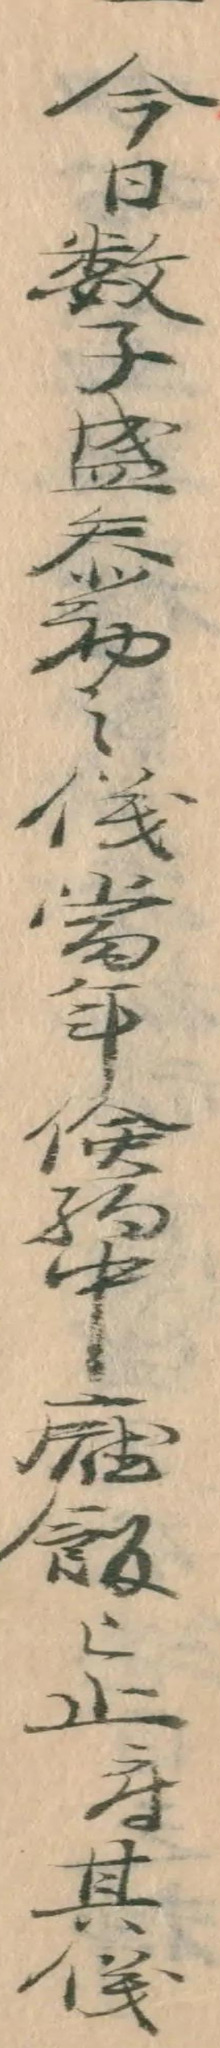一今日数子盛参勤之儀當年倹約中曺廰飯被止ニ付其儀
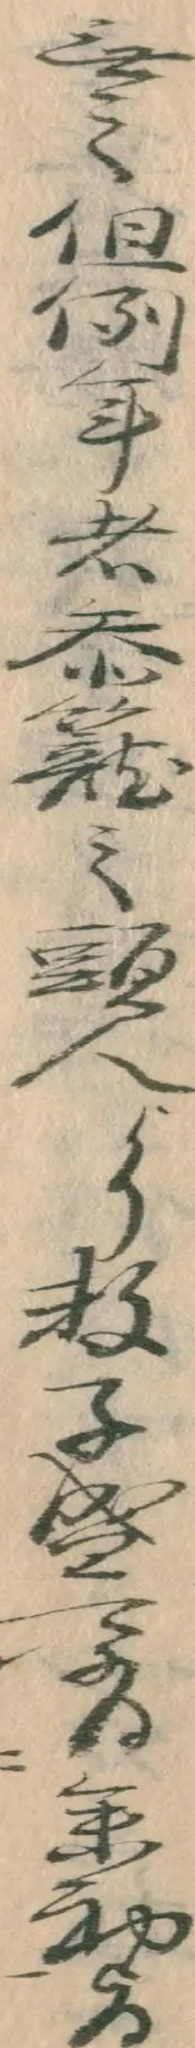無之但例年者黍籠之頭人より数子盛可有参勤旨
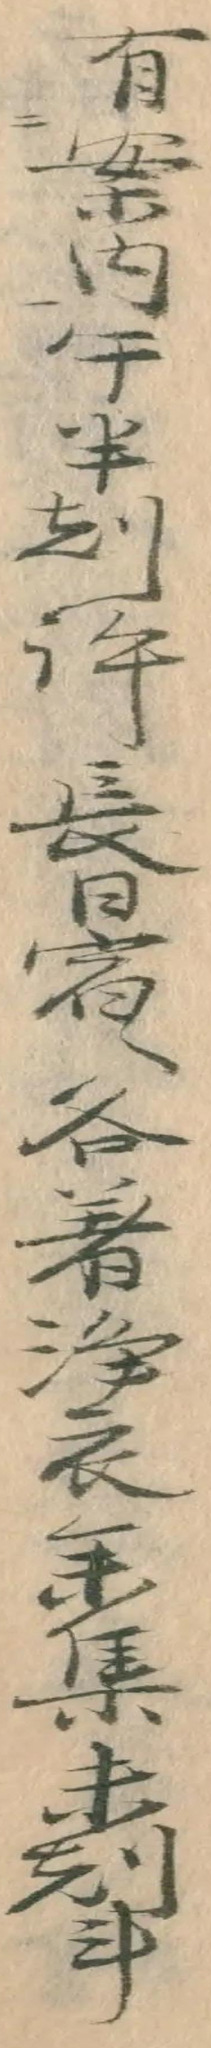有案内午半刻許長日宿へ各着浄衣参集未刻斗
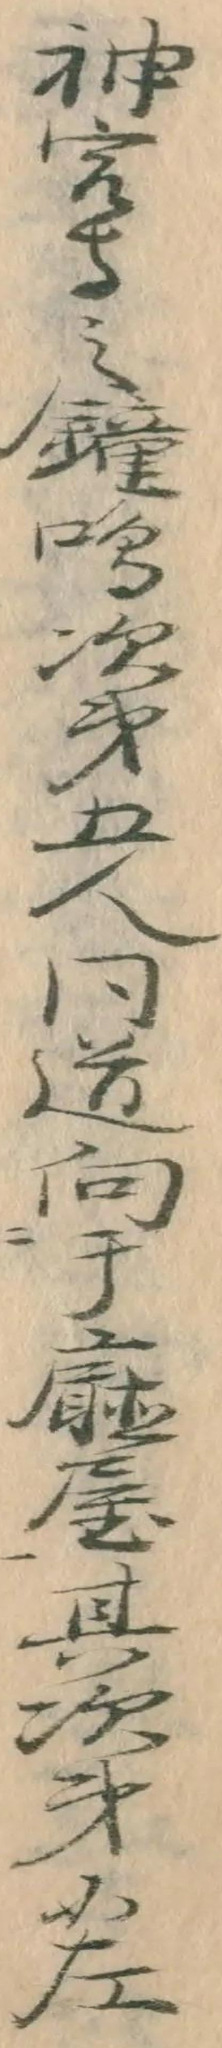神宮寺之鐘鳴次第五人同道向于廰屋其次第如左

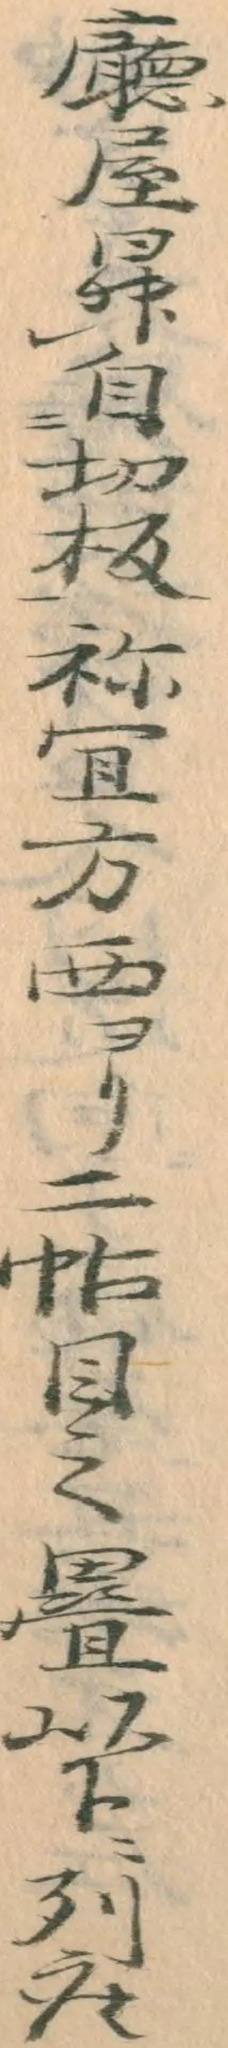廰屋昇自切板祢宜方西ヨリ二帖目之畳以下ニ列座
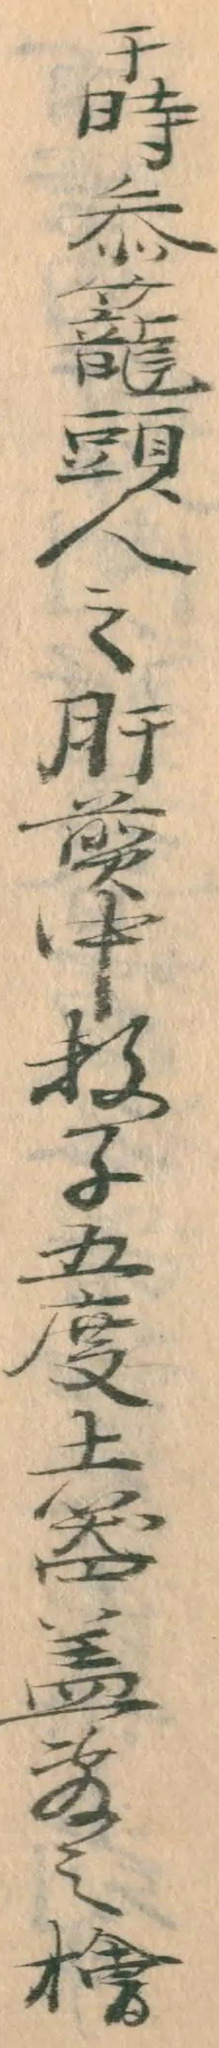于時参籠頭人之肝煎中数子五度土器蓋敷之檜
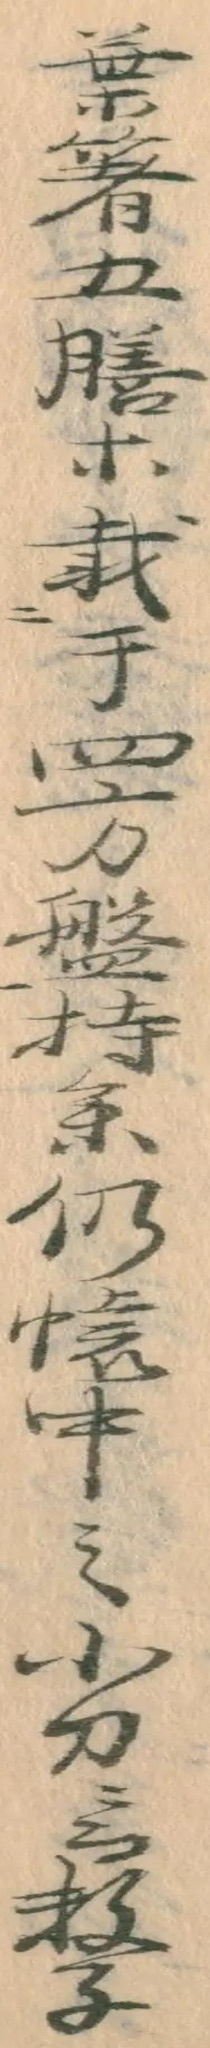葉箸五膳等載于四方盤持参仍懐中之小刀ニ而数子
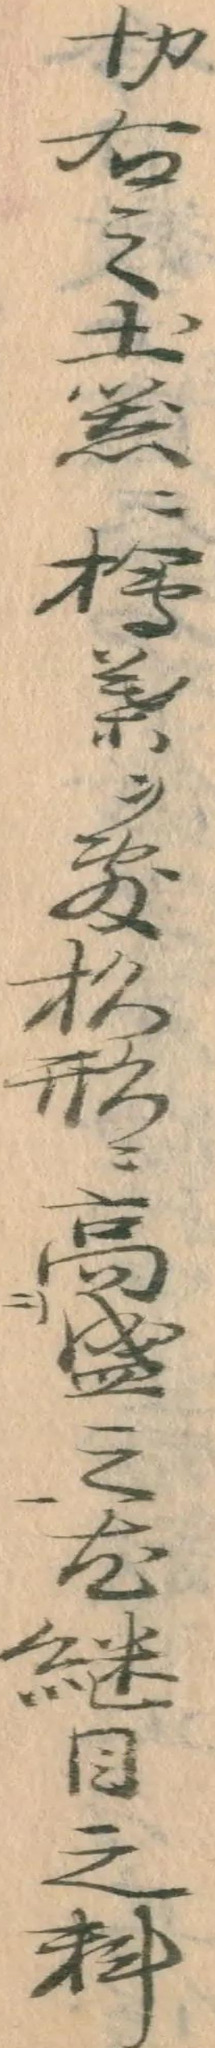切右之土器ニ檜葉ヲ敷杦形ニ高盛之尤継目之料
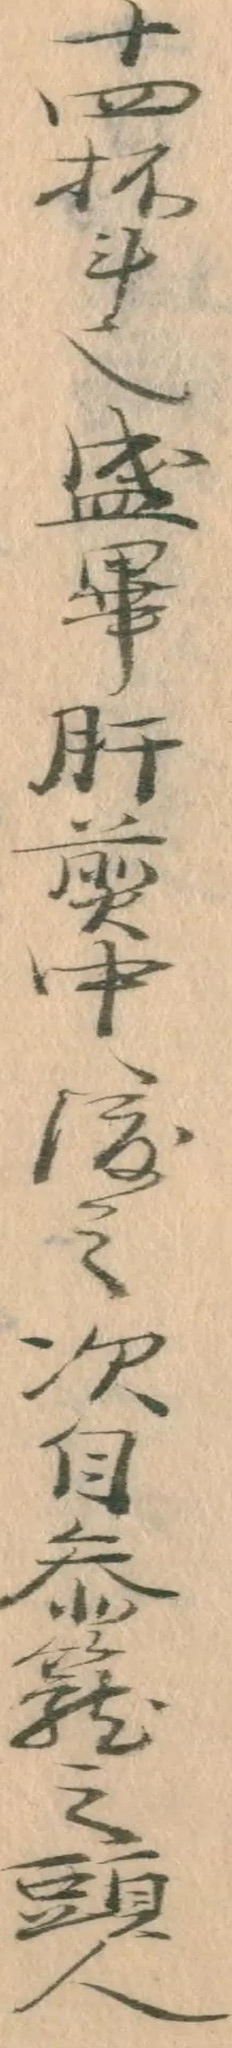十四杯斗也盛畢肝煎中へ渡之次自参籠之頭人
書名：賀茂社記録. 第72冊
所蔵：国立国会図書館 National Diet Library, JAPAN
